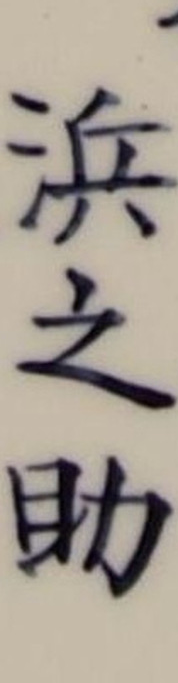兵之助
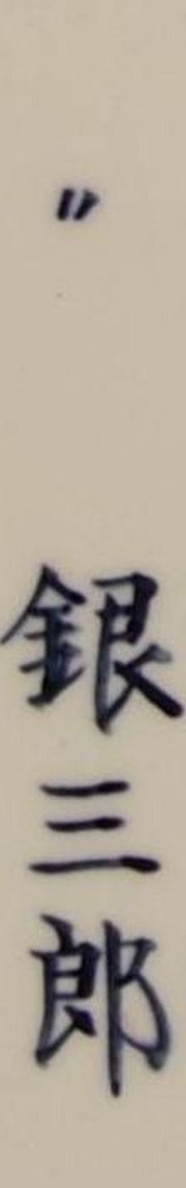銀三郎
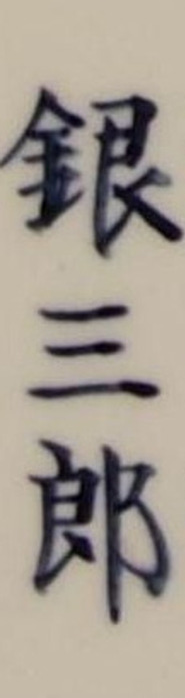銀三郎
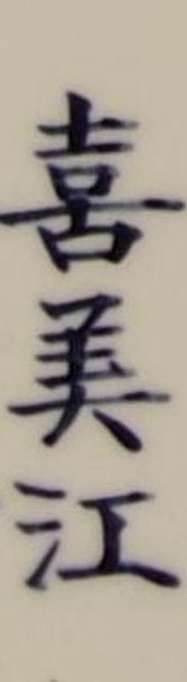喜美江
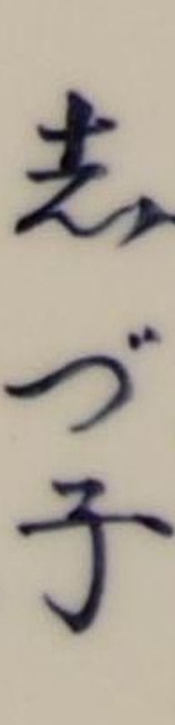しづ子
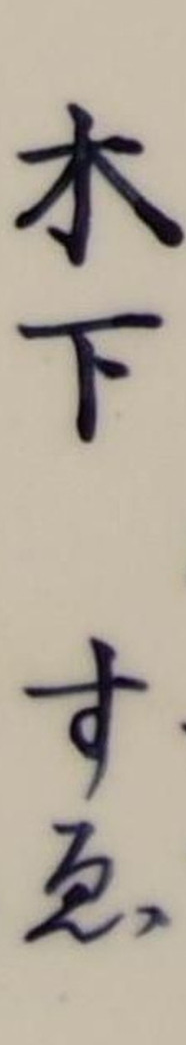木下すえ
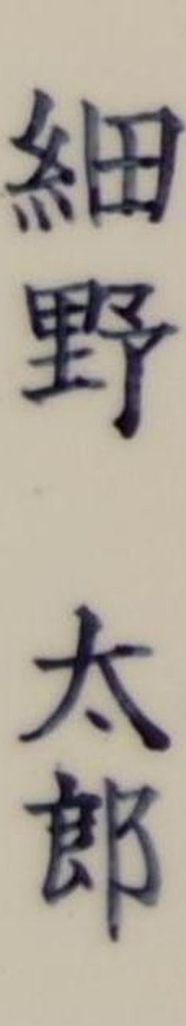細野太郎

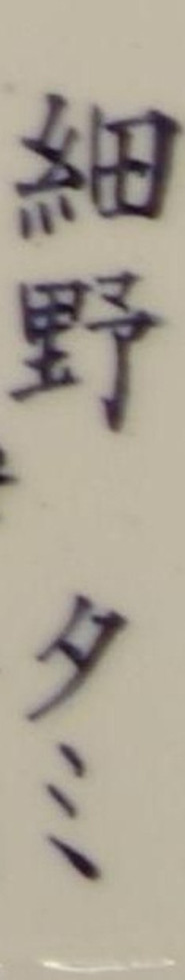細野夕ミ
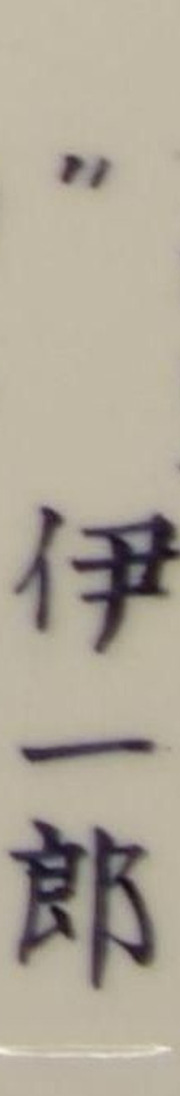伊一郎
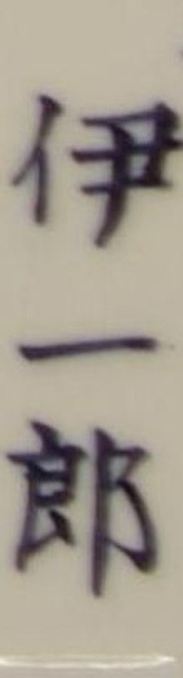伊一郎
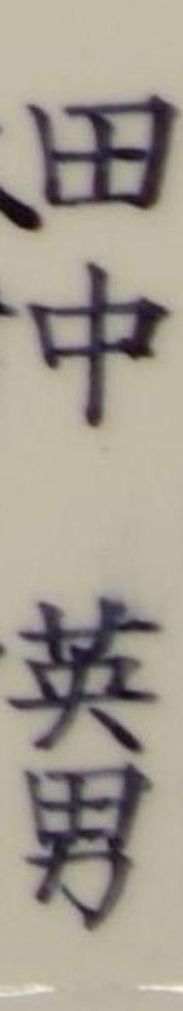田中英男
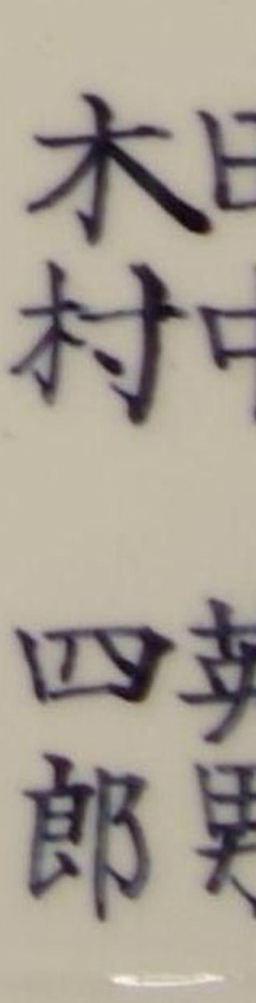木村四郎
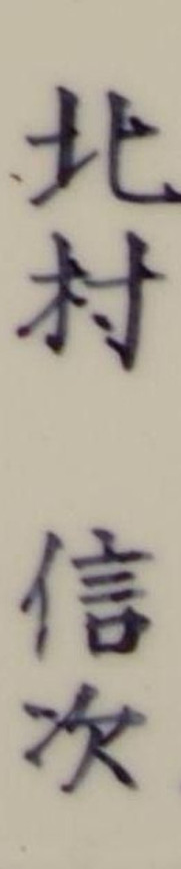北村信次
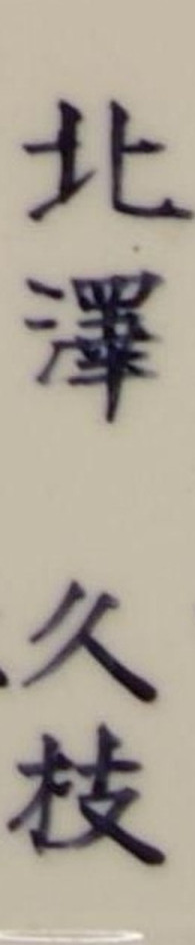北澤久枝
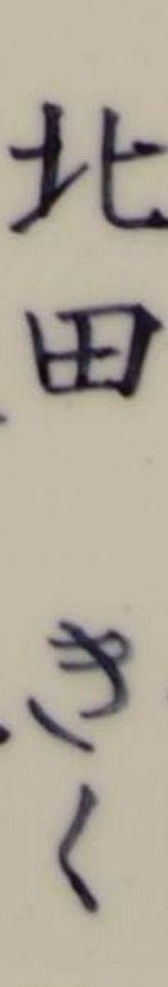北田きく
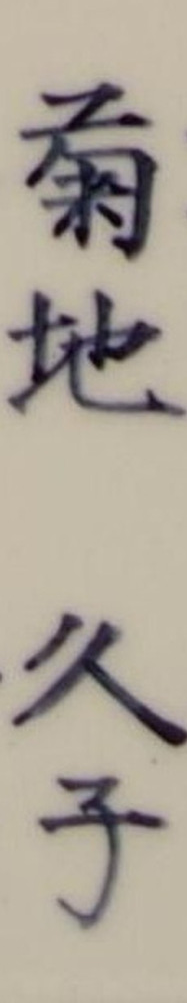菊地久子
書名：E~L
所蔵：高野山金剛峯寺
